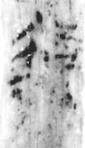○（夕）
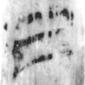己
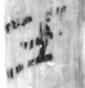壬
